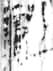○（陷）
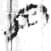於
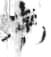未
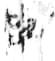○（破）
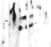於
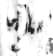申
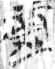坪（平）
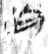於
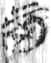梄（酉）
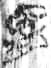寍（寧）
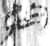於
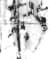戌
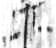工（空）
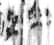於
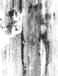亥
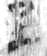坐
